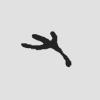又
